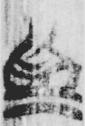爲
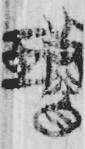璿
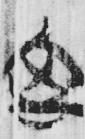室
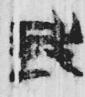○（飾）
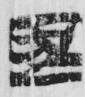爲
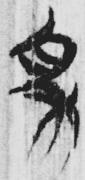○（瑤）
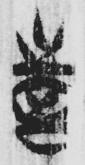臺
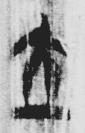立
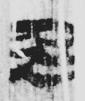爲
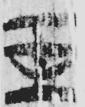玉
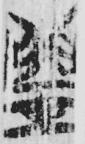閏（門）
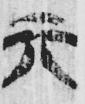亓（其）
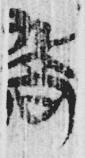喬（驕）
